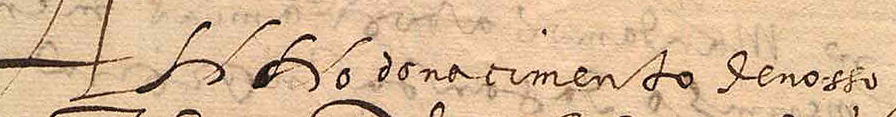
ANNo do nacimento de nosso
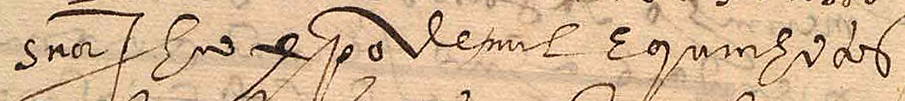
sn̄or Jhū xp̄o de miL E quinhētos
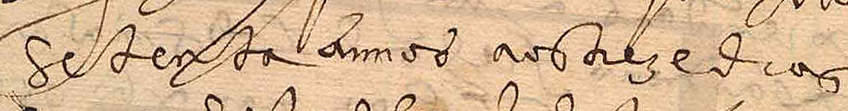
setenta annos aos treze dias
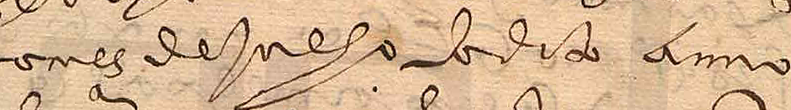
do mes de Julho do dito anno
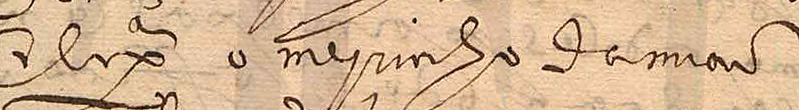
ē lixa o mejrinho damiaõ
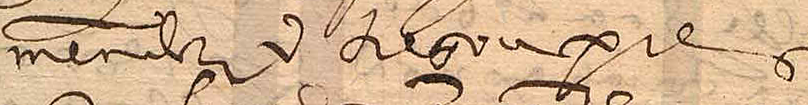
mendez ētregou preso
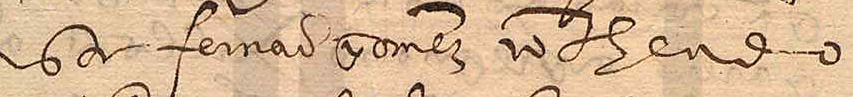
este fernaõ gomez cōtheudo
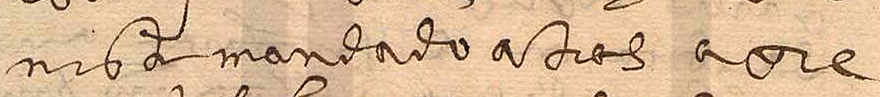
neste mandado atras a gre
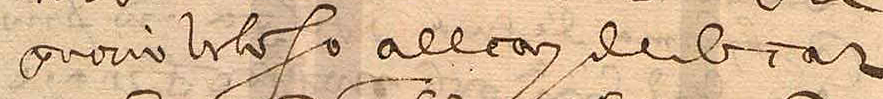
guorio veloso allcayde do car
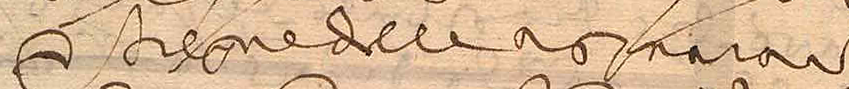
ētregue delle asjnaraõ
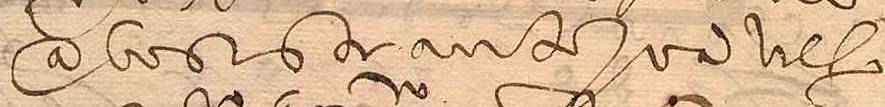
ābos este auto Joā velho
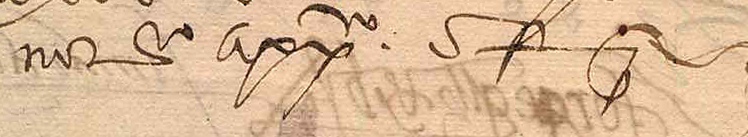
notro appco. o stp̄vi
